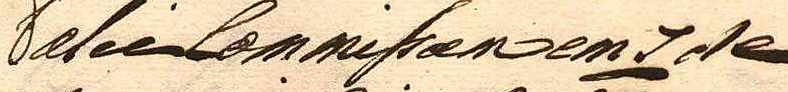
Pela Commissam em 7 de
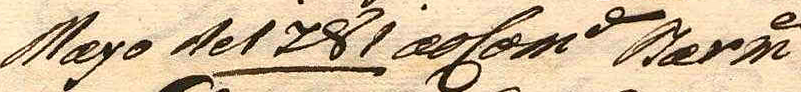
Mayo de 1781 ao Como Barmeu
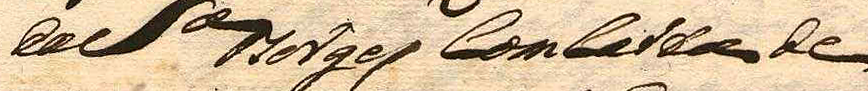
da Sa Borges Com carta de
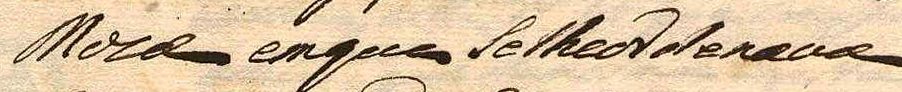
Meza em que selheordenava
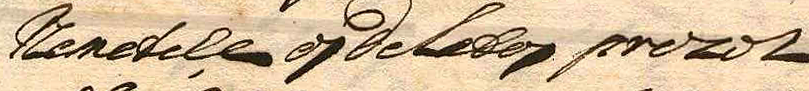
Remeteçe os deLatos prezos
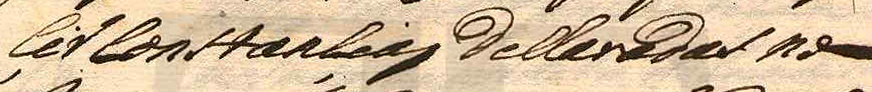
ÇirConstanÇias declaradas no
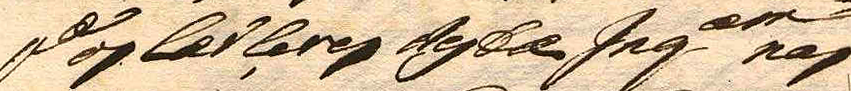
pa os Carçeres desta Jnqam nas
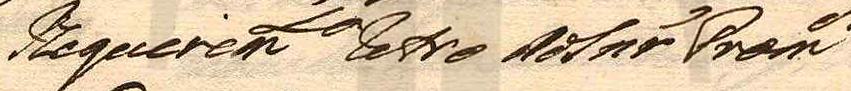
Requerimto Retro do Snr̄ Promor
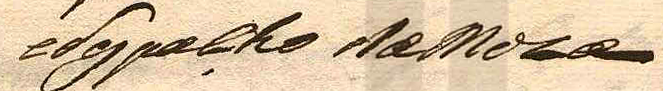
e despaçho da Meza
